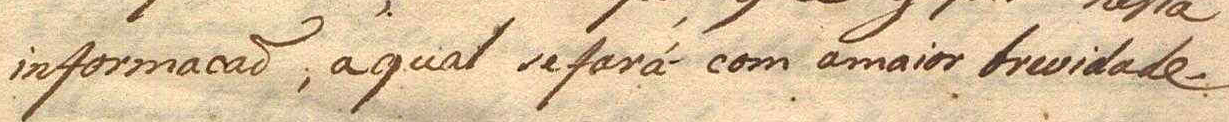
informaçaõ, a qual se fará com a maior brevidade
